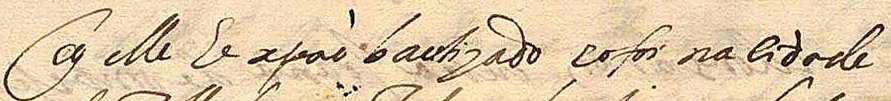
e q̄ elle he xpaõ bautizado e o foi na cidade
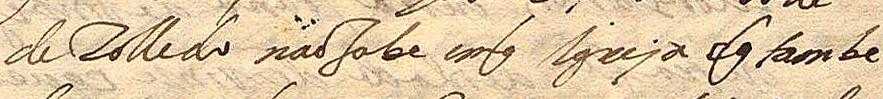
de Tolledo naõ sabe em q̄ Igreja e q̄ tambē
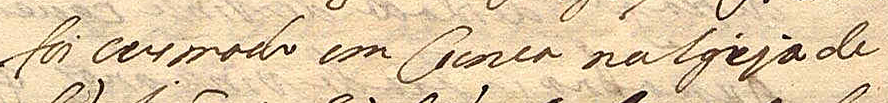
foi crismado em Cuenca na Igrja de
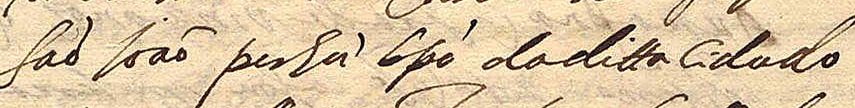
saõ Joaõ por hū bpō da ditta cidado
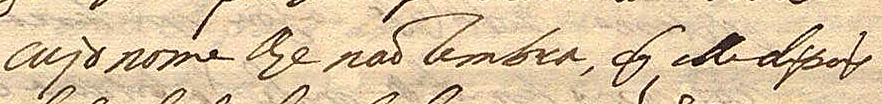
cujo nome lhe naõ lembra, e q̄ elle dipois
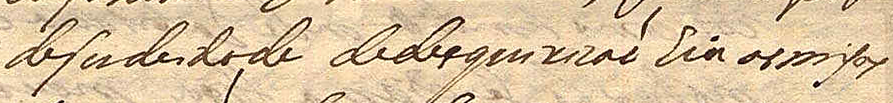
de ser de idade de desquiriçaõ hia as misas
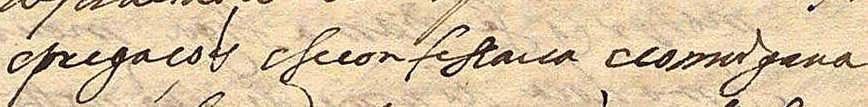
e pregaçoĩs E se confessaua e comūgaua
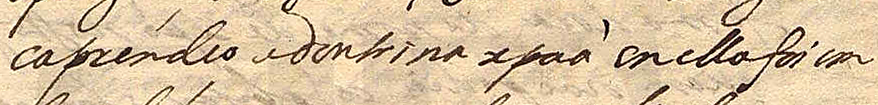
e aprendeo a doutrina xpaā en ella foi em
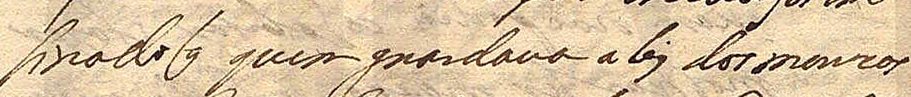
sinado q̄ quem guardaua a lej dos mouros
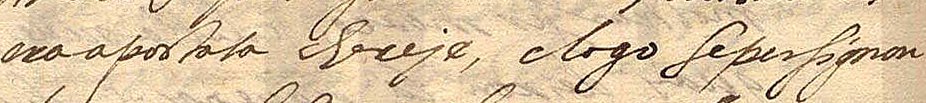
era apostata e hereje, e logo se persignou
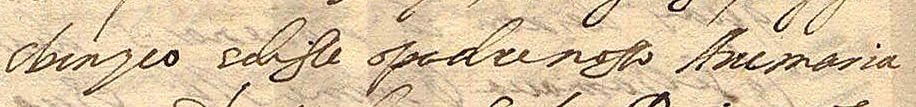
e benzeo e disse o padre nosso Aue maria
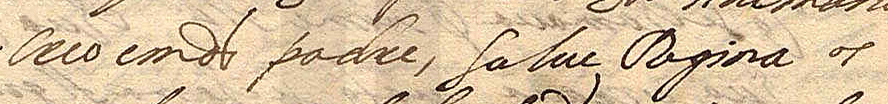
creo em ds̄ padre, salue Regina os
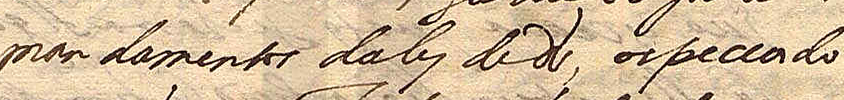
mandamentos da lej de ds̄, os peccado
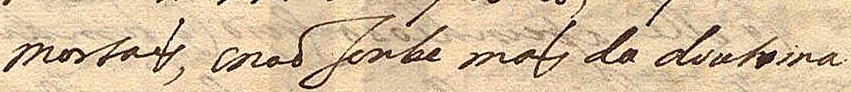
mortais, e naõ soube mais da doutrina
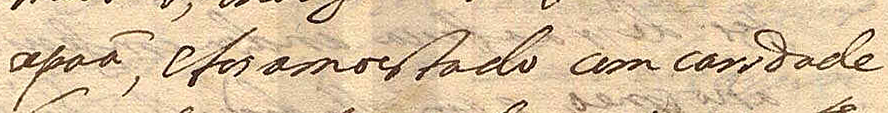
xpaā, e foi amoestado com caridade
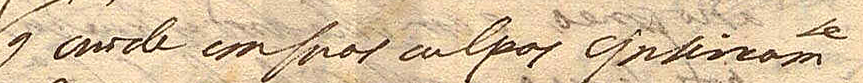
q̄ cuide em suas culpas e inteiramte
